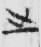之
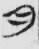月
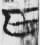甲
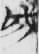戌
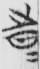之日
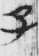子
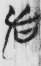左
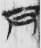尹
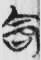命
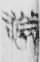漾
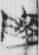陵
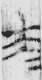大夫
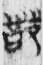○（察）
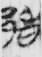郜
